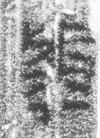○（錦）
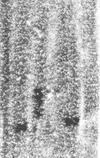之
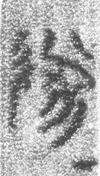○（繸）
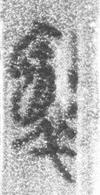裀（絪）
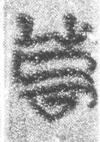{艸石}席
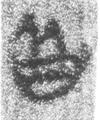皆
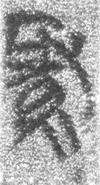緅
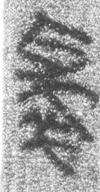襡
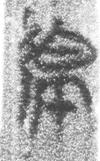綿（縵）
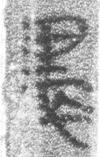裏
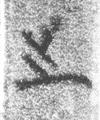之
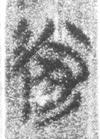○（繸）
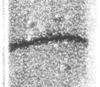一
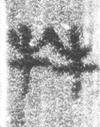友
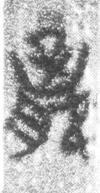○（臝）
